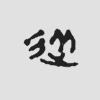從
